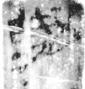○（荆）
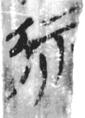𫵖
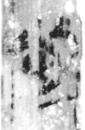○（夏）
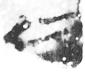𫵖
